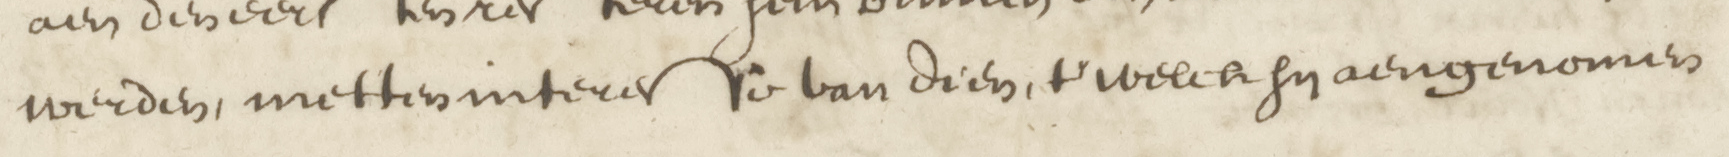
werden, metten interesse van dien, t‛welck hy aengenomen
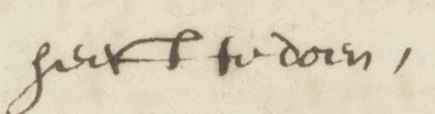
heeft te doen.
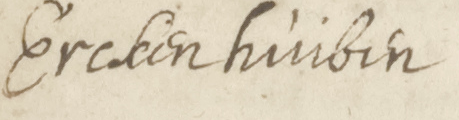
Ercken huiben
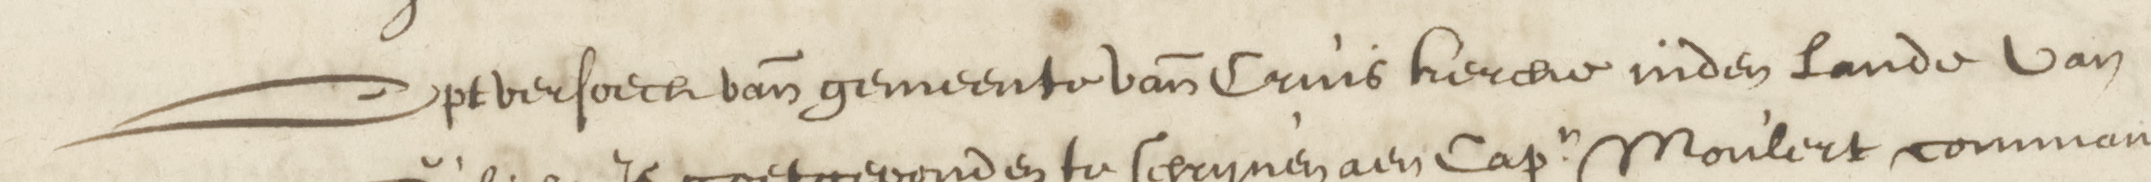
Opt versoeck van gemeente van Cruis kercke inden Lande van
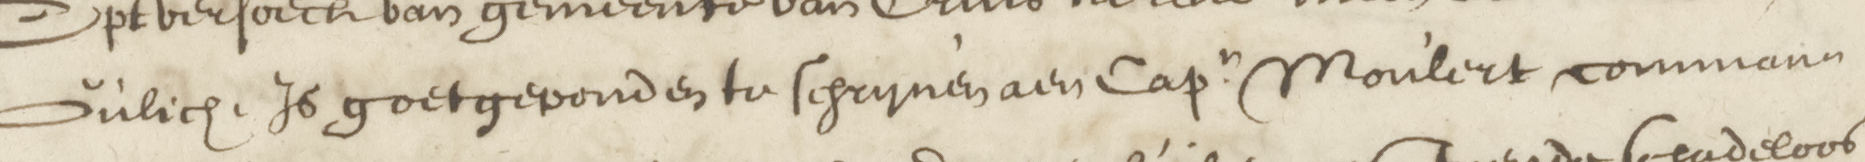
Gulich, Is goetgevonden te schryuen aen Capn Moulert comman„
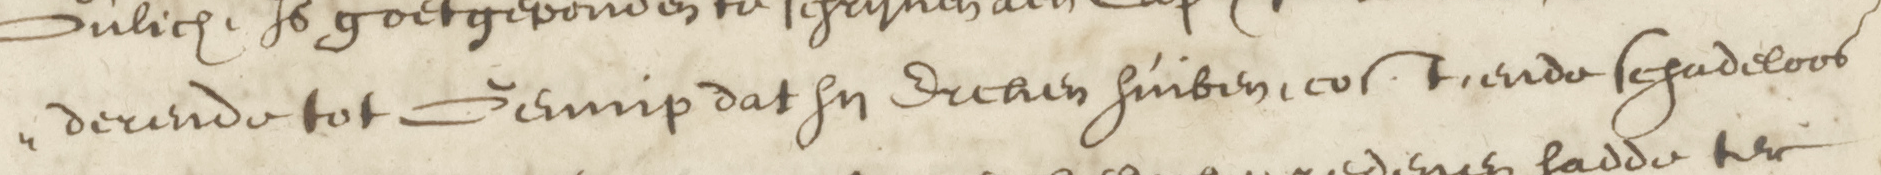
,,derende tot Gennip dat hy Ercken huiben, cost, ende schadeloos
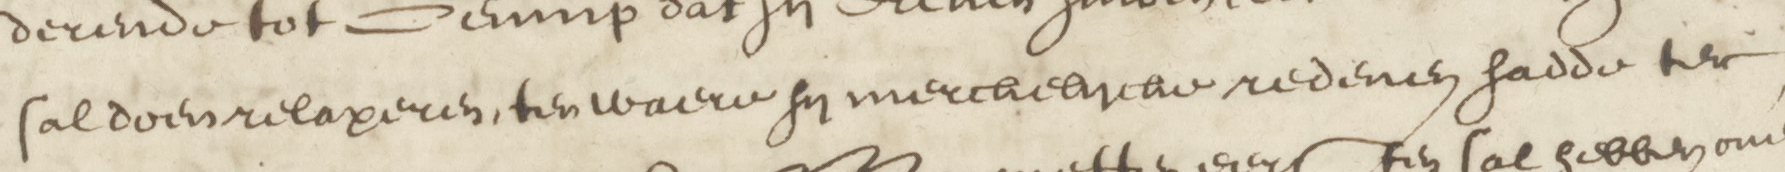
sal doen relaxeren, ten waere hy merckelycke redenen hadde ter
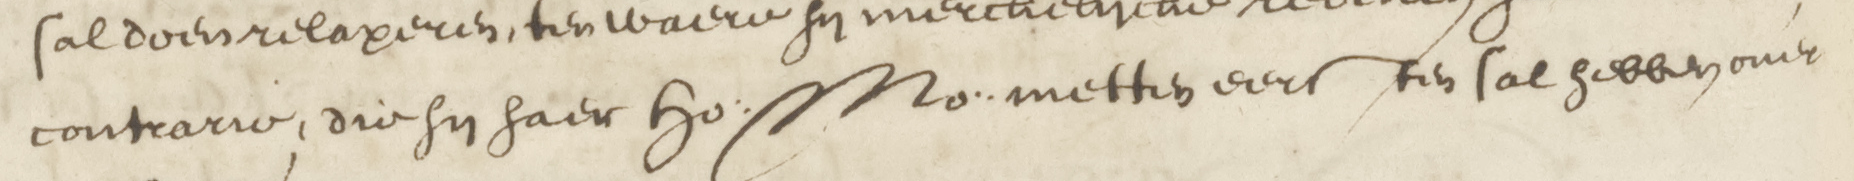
contrarie, die hy haer ho:Mo: metten eersten sal hebben over
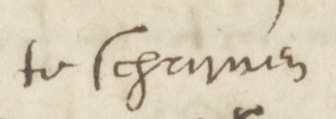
te schryuen
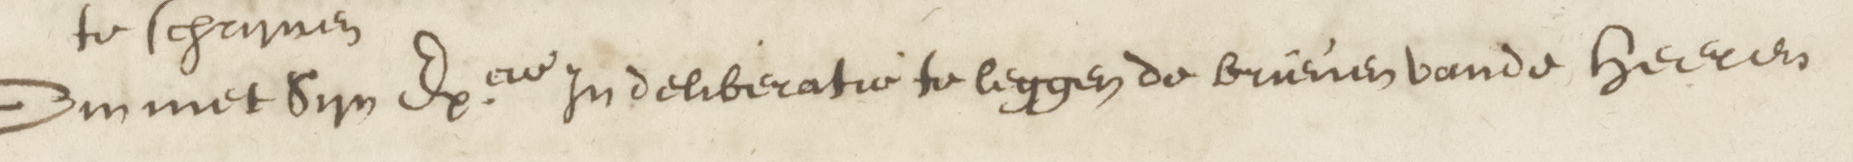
Om met Syn Excie. In deliberatie te leggen de brieuen vande heeren
